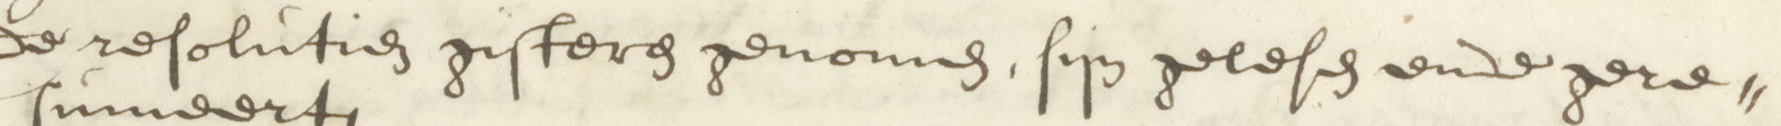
De resolutien gisteren genomen, sijn gelesen ende gere„
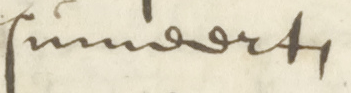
sumeert.
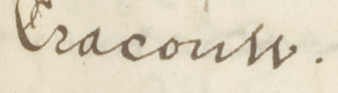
Cracouw.
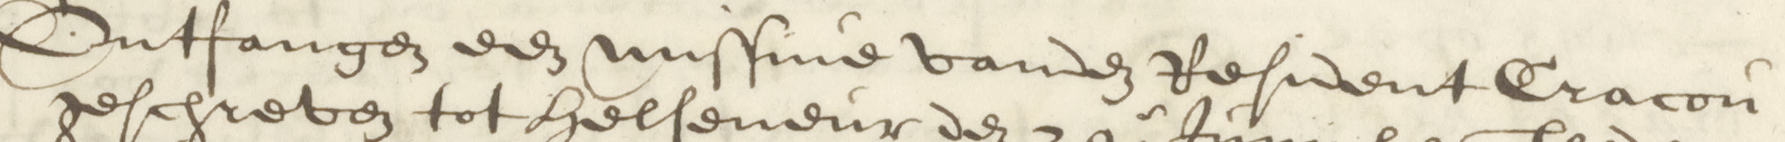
Ontfangen een missive vanden Resident Cracou
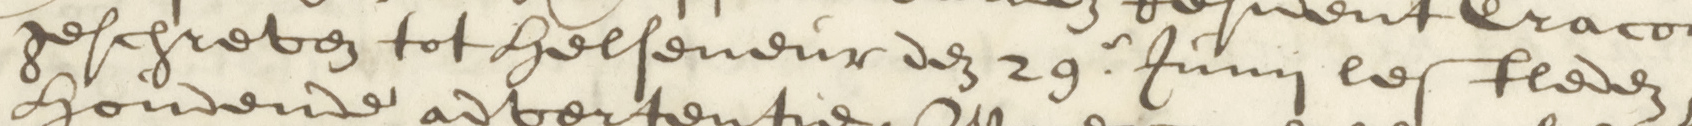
geschreven tot Helseneur den 29e. Junij lestleden,
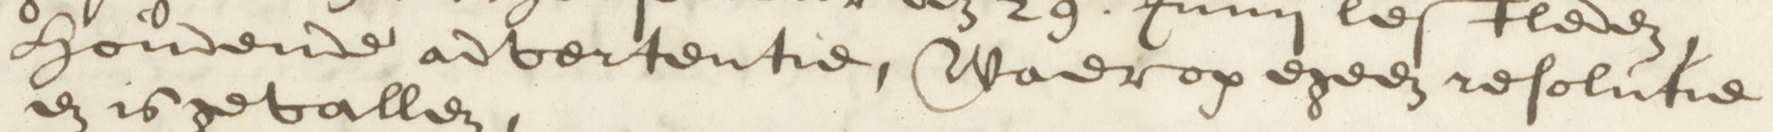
houdende advertentie. Waerop egeen resolutie
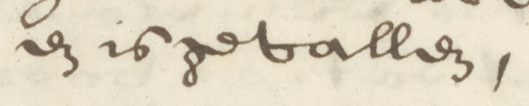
en is gevallen.
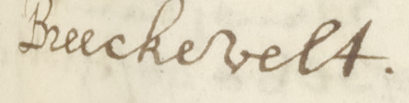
Breeckevelt.
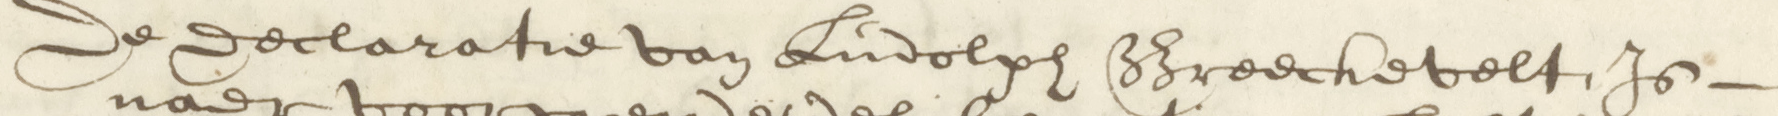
De declaratie van Ludolph Breeckevelt, Is
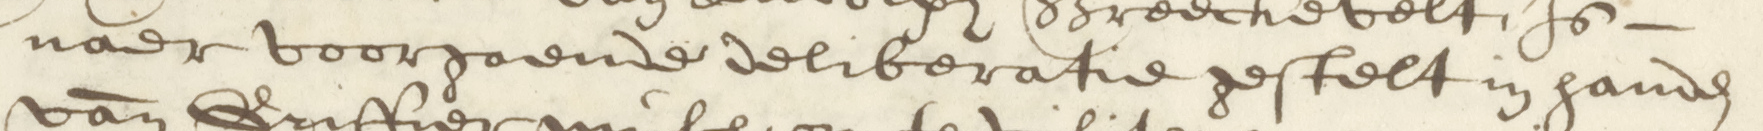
naer voorgaende deliberatie gestelt in handen
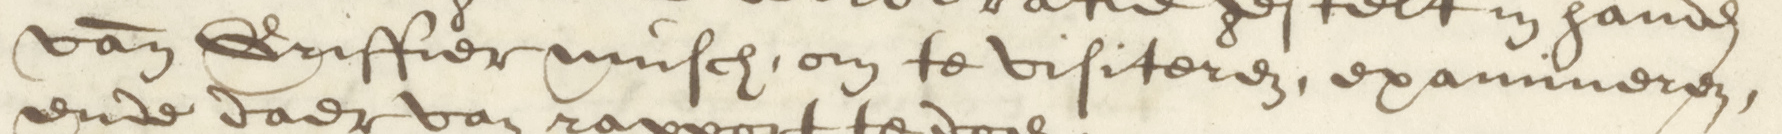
van Griffier Musch, om te visiteren, examineren,
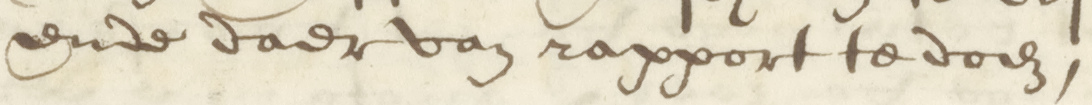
ende daer van rapport te doen.
